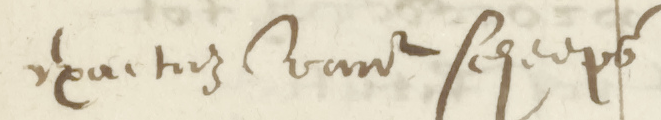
Exacten van scheeps
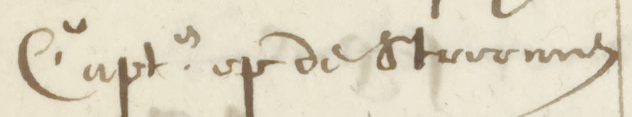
Captn op de stroomen
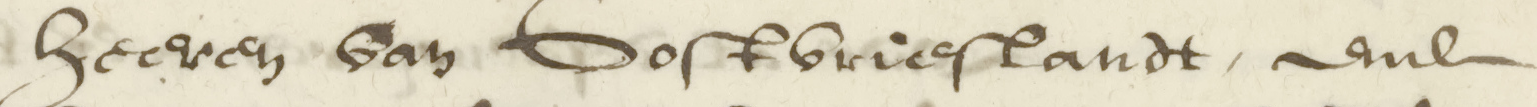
heeren van Oostvrieslandt, ende
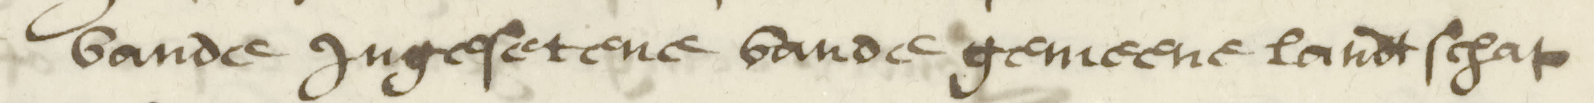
vande ingesetene vande gemeene landtschap
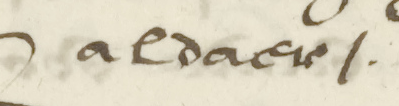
aldaer.
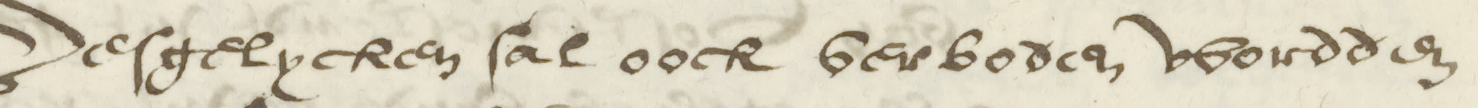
Desgelycken sal oock verboden wordden
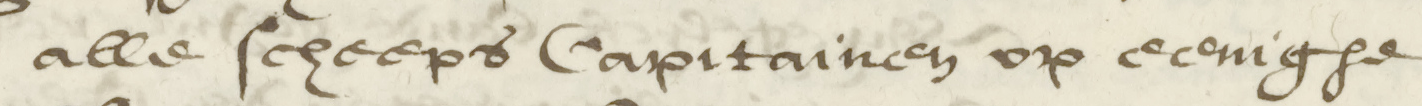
alle scheeps capitainen op eenighe
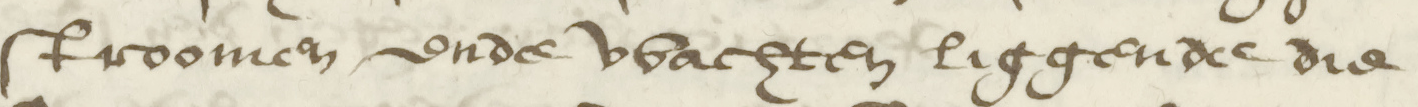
stroomen ende wachten liggende die
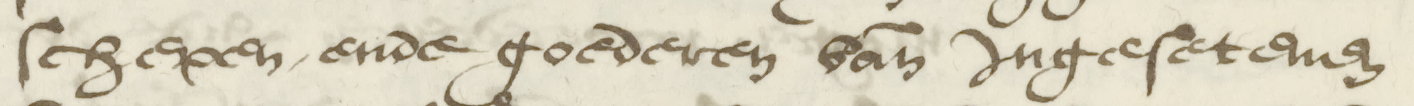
schepen ende goederen van ingesetenen
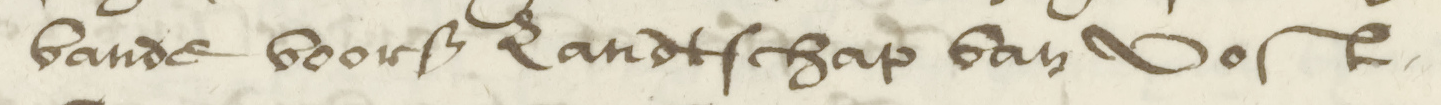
vande voors Landtschap van Oost„
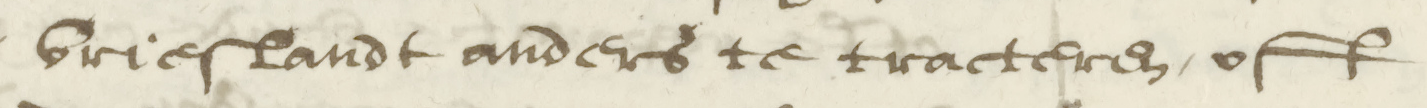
vrieslandt anders te tracteren, off
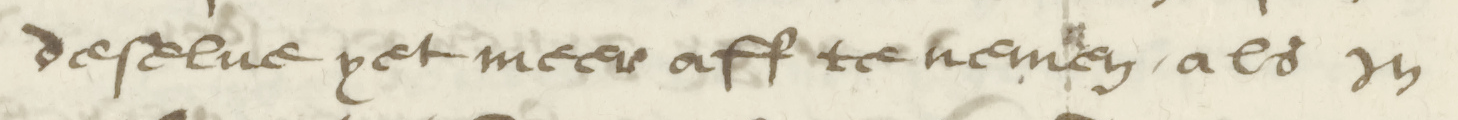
deselue yet meer aff te nemen, als in
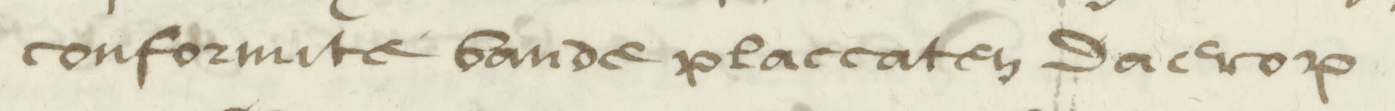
conformite vande placcaten daerop
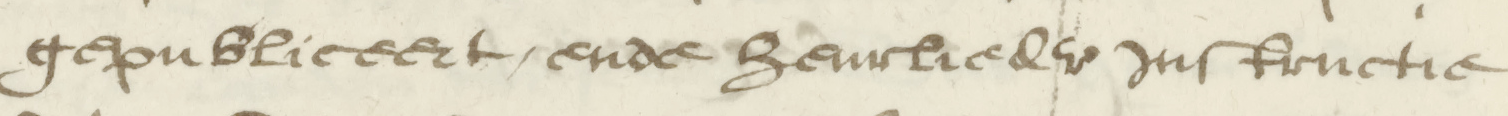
gepubliceert ende heurlieder instructie
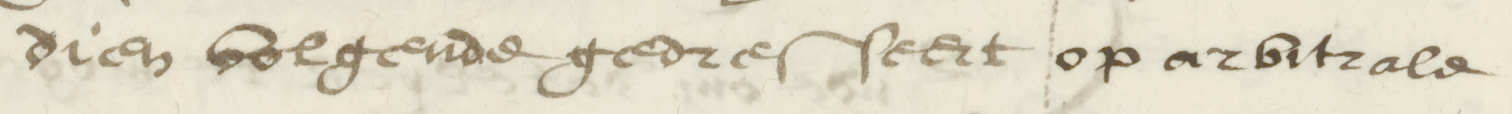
dien volgende gedresseert op arbitrale
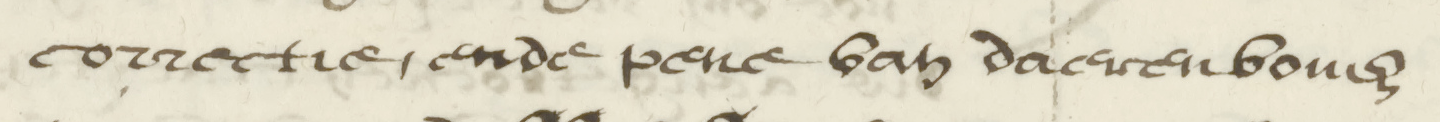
correctie, ende pene van daerenbouen
